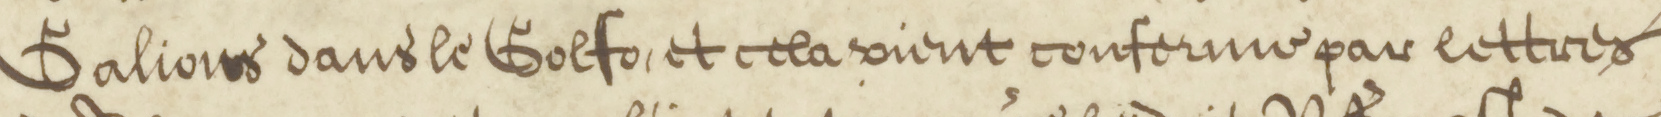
Galions dans le Golfo, et cela vient conferme par lettres
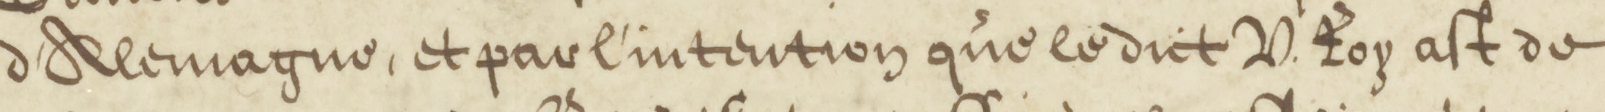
d‛Alemagne, et par l‛intention que le dict V. Roy ast de
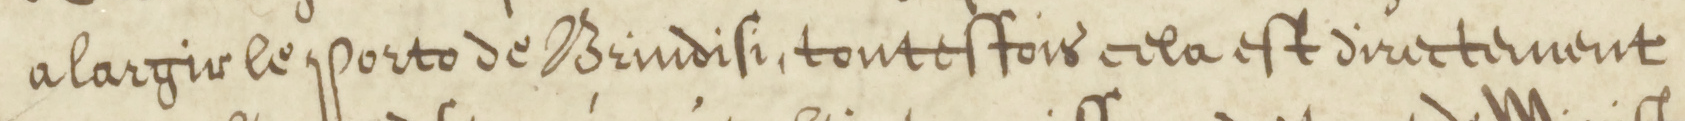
alargir le Porto de Brindisi, toutesfois cela est directement
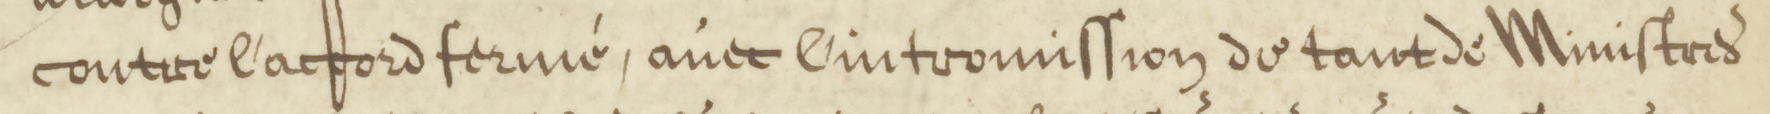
contre l‛accord fermé auec l‛intromission de tant de Ministres
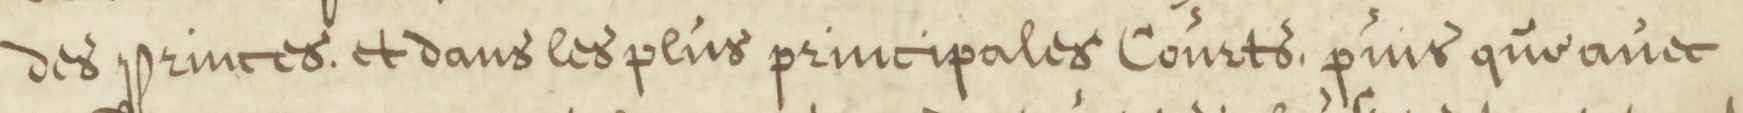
des princes. et dans les plus principales Courts, puis que auec
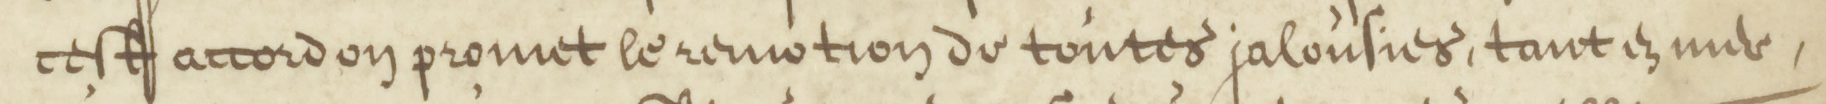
cest accordon promet le reniotion de toutes jalousies, tant en mer,
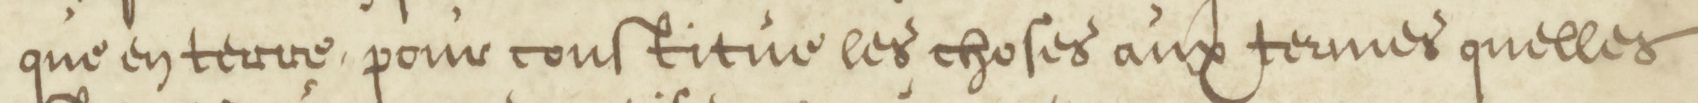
que en terre, pour constitue les choses aux termes quelles
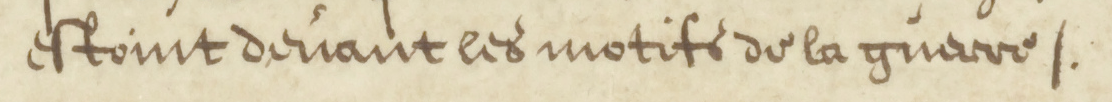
estoint deuant les motifs de la guerre.
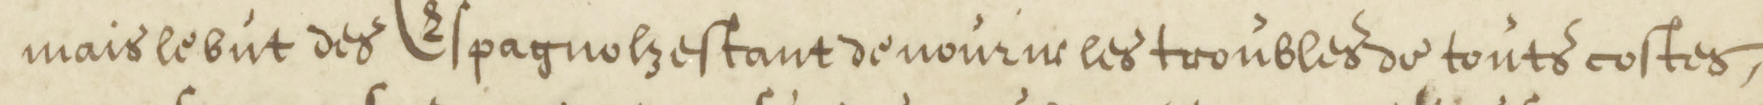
mais le but des Espagnolz estant de nourir les troubles de touts costes,
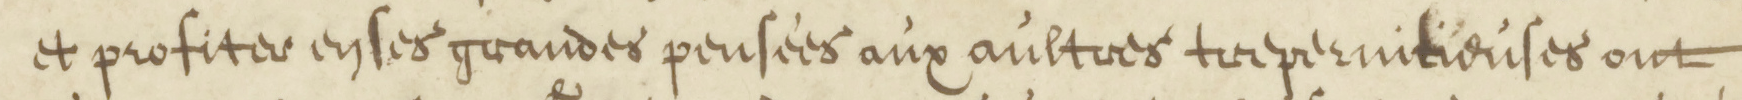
et profiter en ses grandes pensées aux aultres trepernitieuses ont
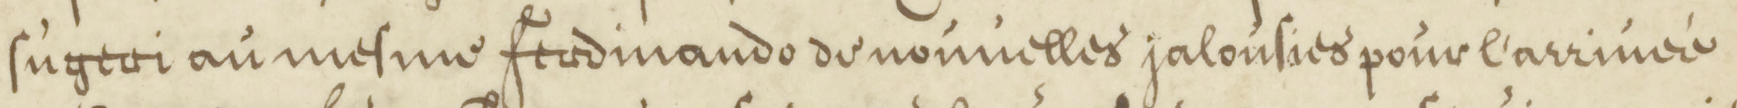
sugeri au mesme Ferdinando de nouuelles jalousies pour l‛arriveé
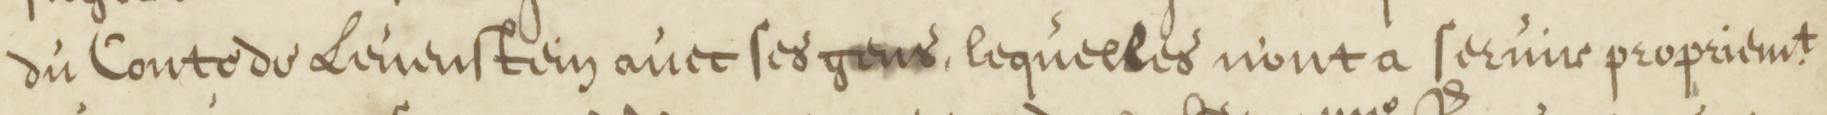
du Conte de Leuenstein auec ses gens, lesquelles n‛ont a seruir propriemt.
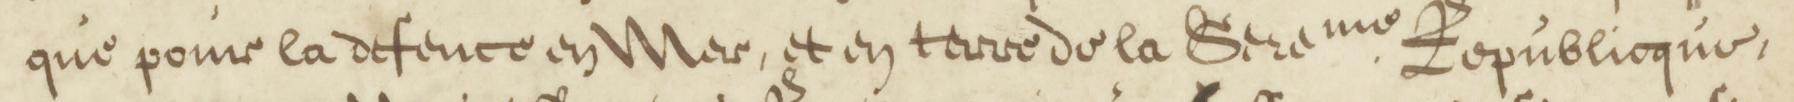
que pour la defence en Mer, et en terre de la Sereme. Republicque,
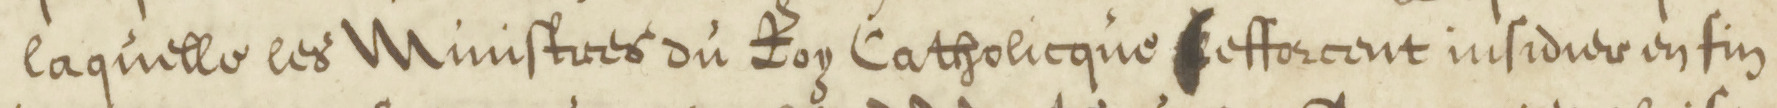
laquelle les Ministres du Roy Catholicque efforcent insidier en fin
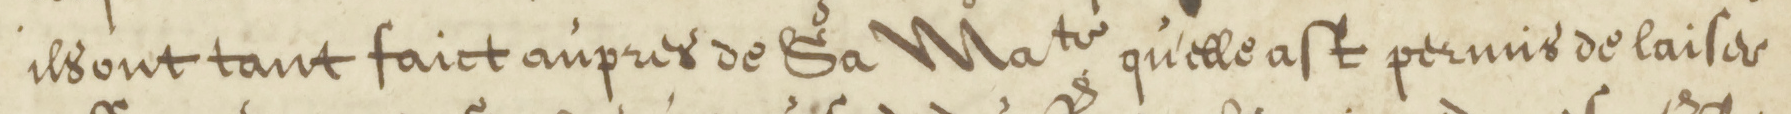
ils ont tant faict aupres de Sa Mate. quelle ast permis de laiser
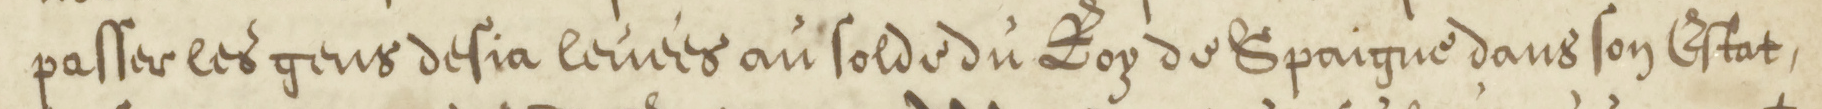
passer les gens desia leuées au solde du Roy de Spaigne dans son Estat,
